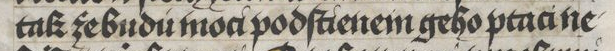tak że budú moci pod ſtienem geho ptaci ne¬
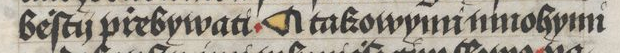beẛtij pṙebywati. A takowymi mnohymi
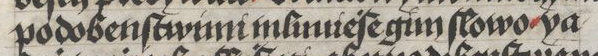podobenſtwimi mluuieẛe guc ſlowo.y a¬
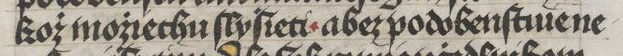kož możíechu ſlyẛieti.abez podobezſtne ne¬
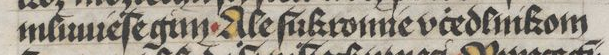mluuíeẛe gim.Ale ſukromíe vċedlníkom
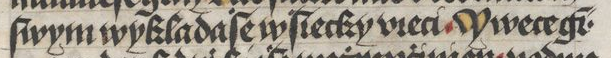ſwym wykladaẛe wſiecky vieci.Ywece ḡt.
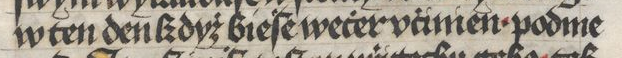w ten den kdyż bíeẛe weċer.uċinien.podme
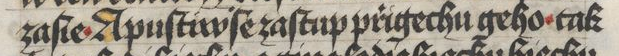zaſie.A puſtiwẛe zaſtup přigechu geho.tak
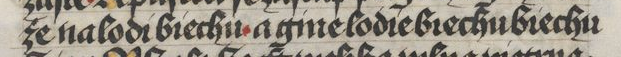že na lodí bíechu.a gine lodie bíechu bíechu
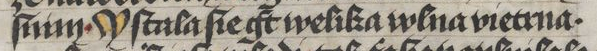ſnim.Y ſtala ſie ḡt welika wlna wietrna.
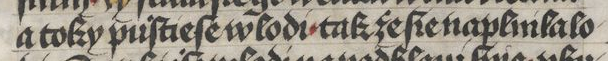a toky puẛtíeſe volodi.tak że ſie naplnila lo¬
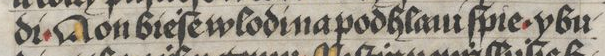dí. A on bíeẛe wlodí na podhlauí ſpie.y bu¬
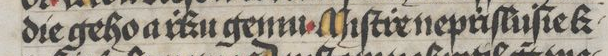die geho a ṙku gemu.Miſtṙe nepṙiſluẛie k
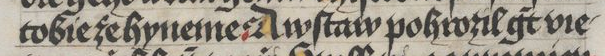tobie že hyneme?A wſaw pohrozil ḡt vie¬
